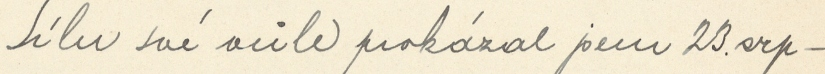Sílu své vůle prokázal jsem 23. srp-
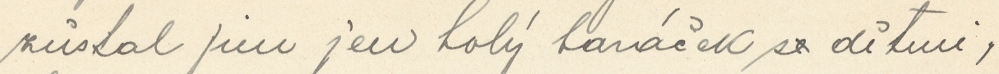zůstal jim jen holý baráček s dětmi,
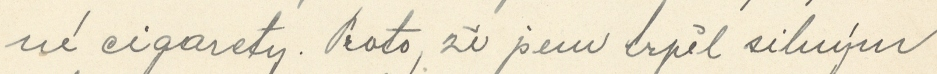né cigarety. Proto, že jsem trpěl silným
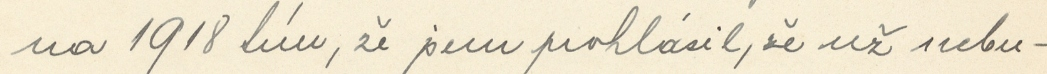na 1918 tím, že jsem prohlásil, že už nebu-
